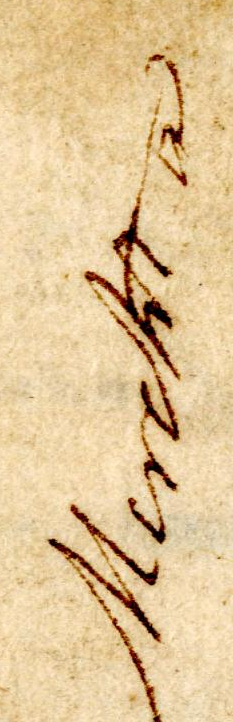Merch^t @
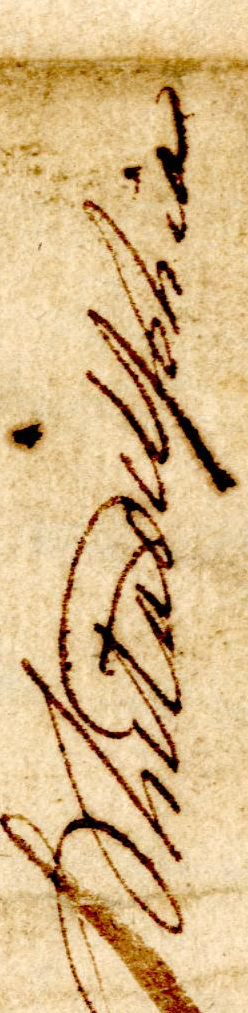Philadelphia
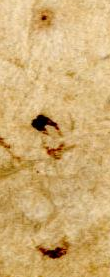To
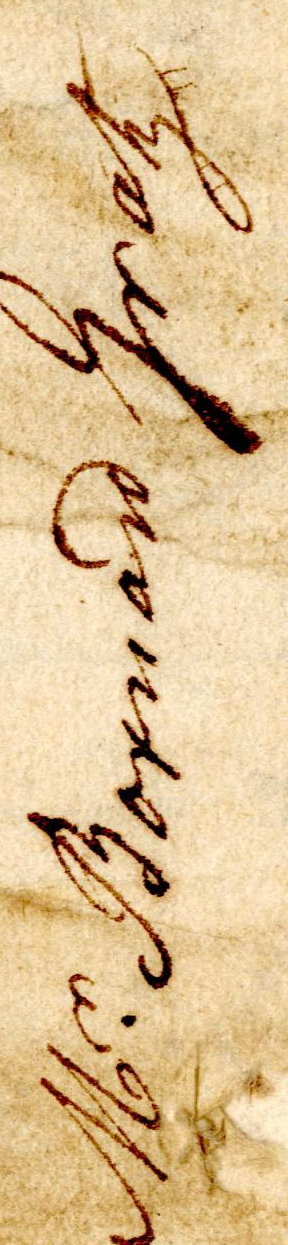M^r Barnard Gratz
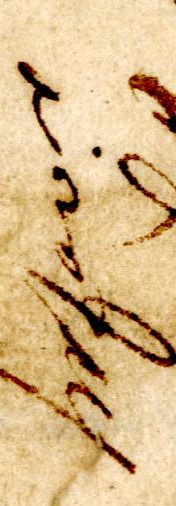p^r Fav^r
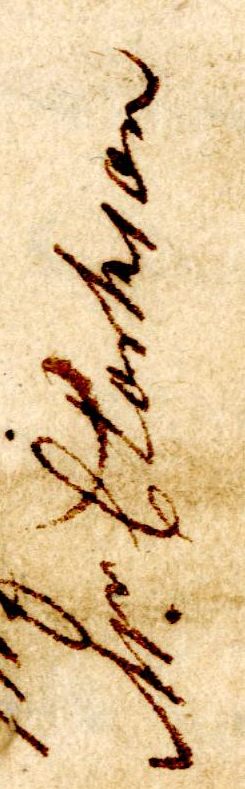M^r Clarkson
